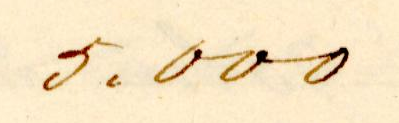5,000
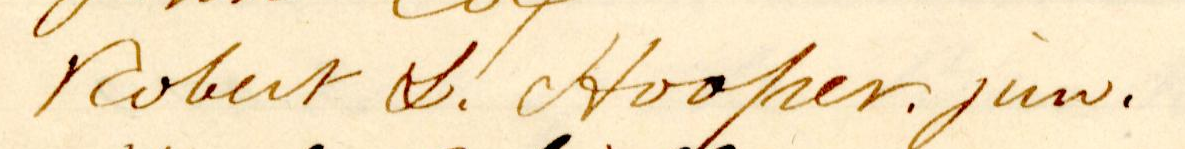Robert L. Hooper jun.
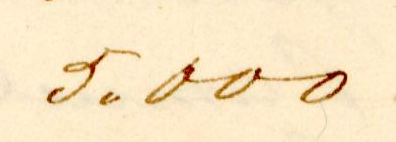5,000
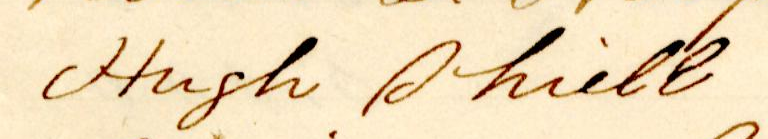Hugh Shiell
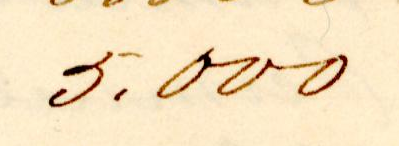5,000
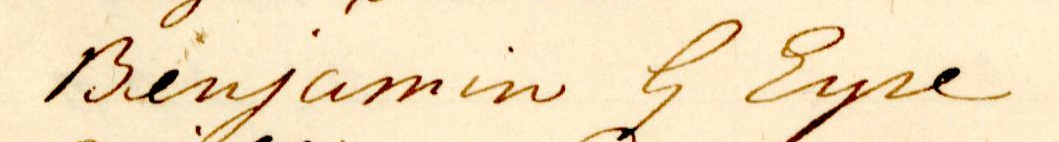Benjamin G Eyse
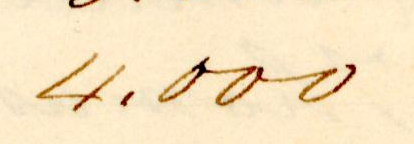4,000
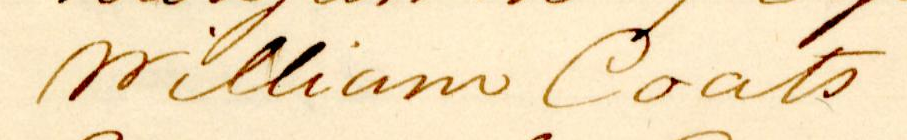William Coats
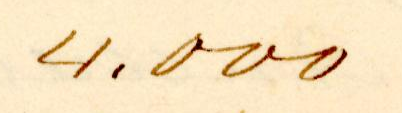4,000
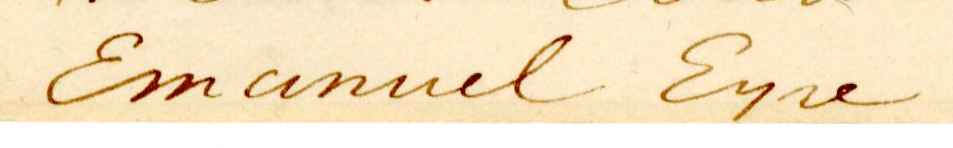Emanuel Eyre
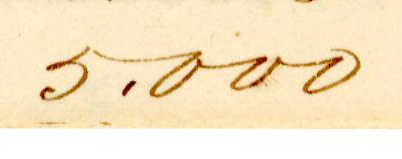5,000
